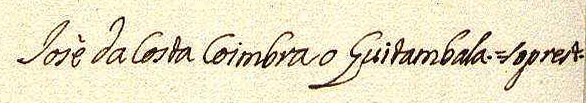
Iosé da Costa Coimbra o Quitambala.= soprest.
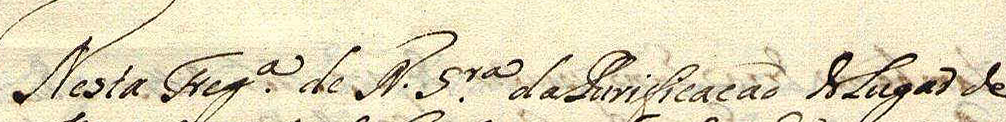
Nesta Freg.a de N. S.ra da Purificaçaõ do Lugar de
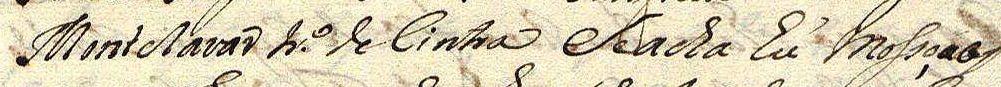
Montelavar tr.o de Cintra Se acha hū mosso ao q
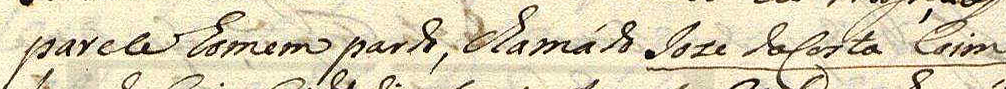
parece homem pardo, chamado Ioze da Costa Coim
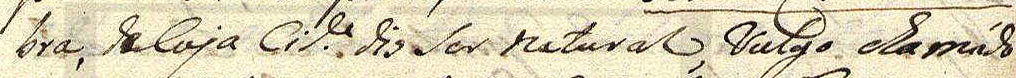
bra, de Cuja Cid.e dis ser natural, Vulgo chamado
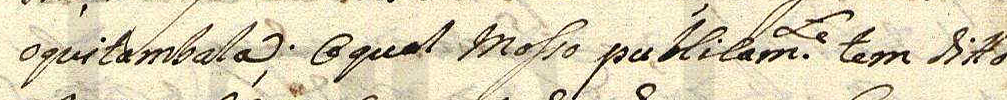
o quitambala; O qual mosso publicam.te tem ditto
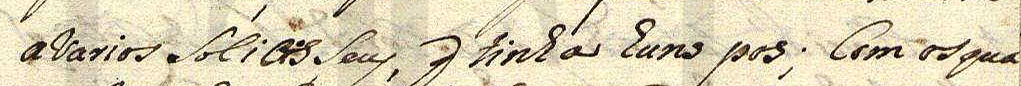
a varios solicis seus, q̄ tinha huns pos; Com os qua
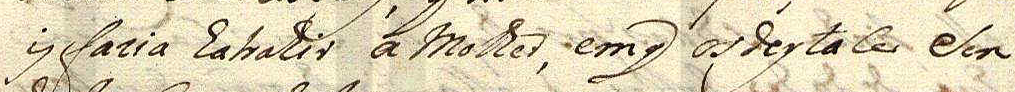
is fazia hatrahir a molher, em q̄ os deytaCe Sen
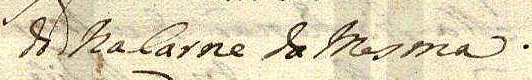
do na Carne da mesma.
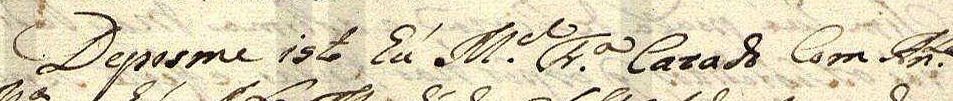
Deposme isto hū M.el Fr.a Cazado Com An.ta
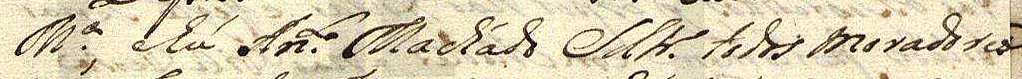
M.a, e hū An.to Machádo Soltr.o todos moradores
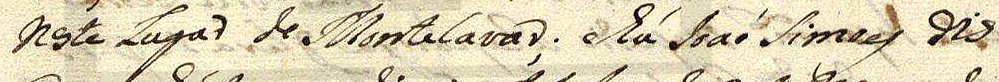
neste Lugar de Montelavar; e hū Ioaõ simoes dis
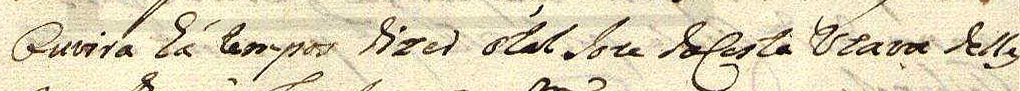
Ouvira há tempos dizer o tal Ioze da Costa Vzava delles
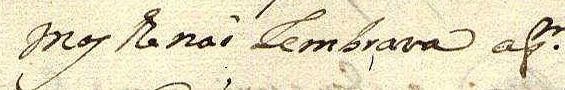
mas lhe naõ Lembrava a q.m
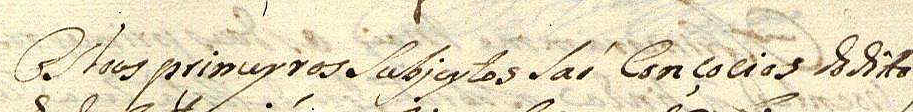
Os dous primeyros subjeytos saõ Conçocios do ditto
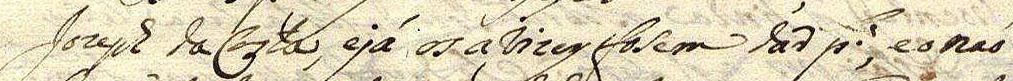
Jozeph da Cozta, e já os avizey fosem dar p.te, e o naõ
